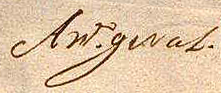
Ant.o geral.
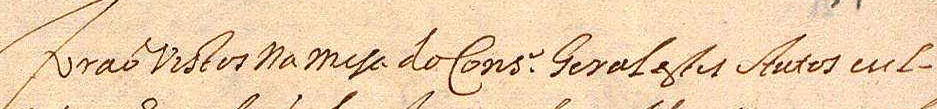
Foraõ vistos na mesa do Cons.o Geral estes Autos cul
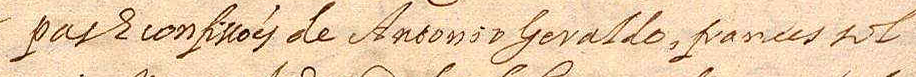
pas E confissoẽs de Antonio Geraldo, frances sol
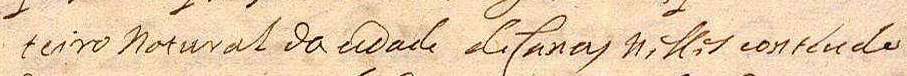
teiro natural da cidade de Canas nelles conteudo
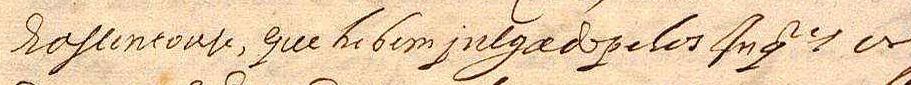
E assentouse, que he bem julgado pelos Jnqres or
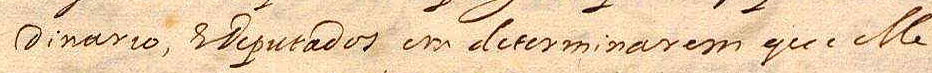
dinario, E deputados em determinarem que elle
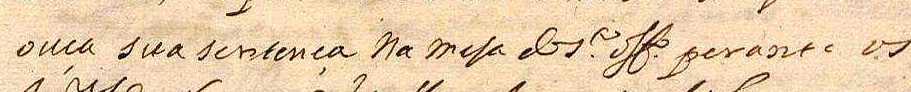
ouça sua sentença na mesa do s.to off.o perante os
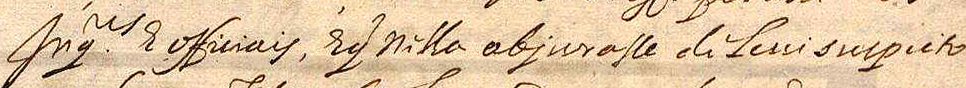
Jnq.res E officiais, E q̄ nella abjurasse de leui suspeito
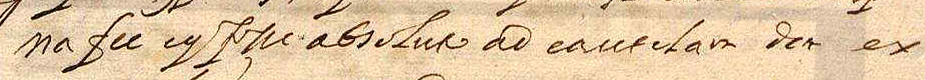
na fee e q̄ fosse absoluto ad cautelam da ex
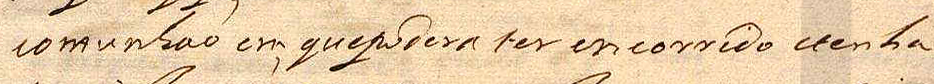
comunhaõ em que podera ter encorrido e tenha
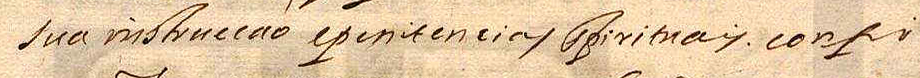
sua instrucçaõ e penitencias spirituais. confir
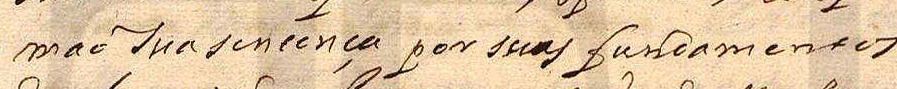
maõ sua sentença por suas fundamentos
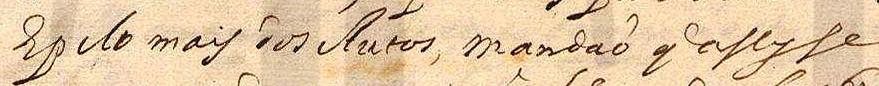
E pelo mais dos Autos, mandaõ q̄ assy se
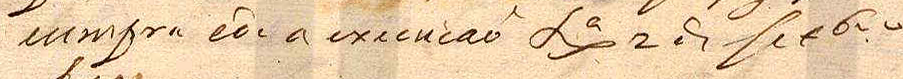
cumpra e de a execuçaõ Lxa 2 de setbr.o
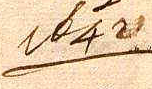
1642
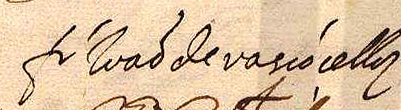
fr̄ Ioaõ de vascōcellos
